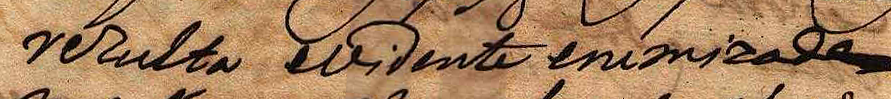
rezulta evidente enimizade
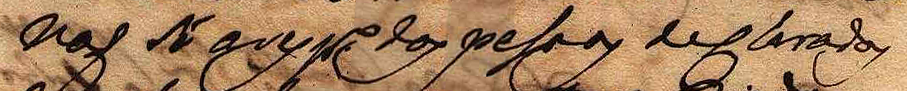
naꝭ só a respo. das pesoas deClaradas
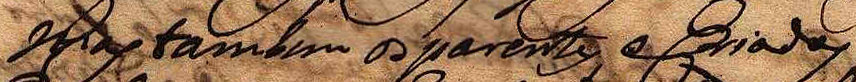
mas tambem os parentes, e Criados
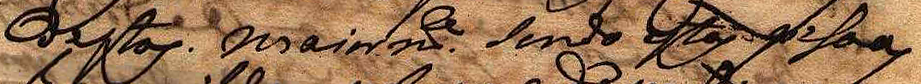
destas maiorm.te sendo estas pesoas
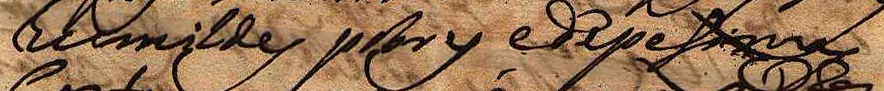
humildes pobres e de pesimos
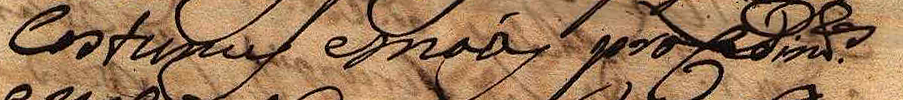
Costumes e mais proCedim.tos
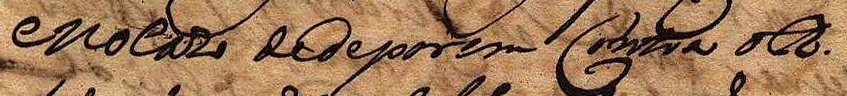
e no cazo de deporem Contra o R.
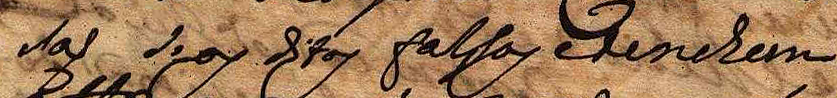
saõ seos ditos falsos e de nehum
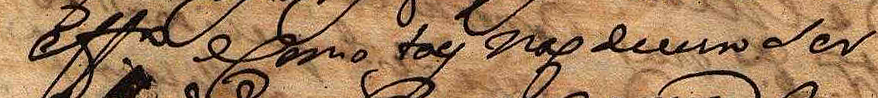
effo e Como taes naꝭ deuem ser
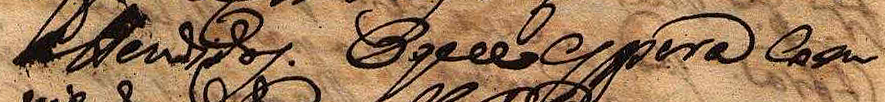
attendidos. E que espera com
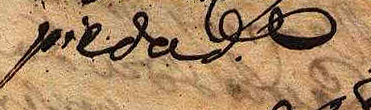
piedad.e
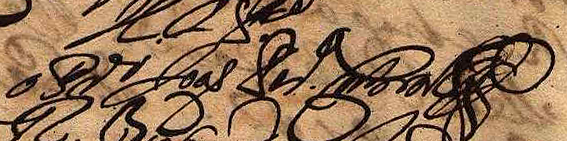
o Pror Joaõ Per.a Cabral
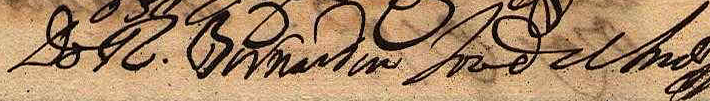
Do R. Bernardino Ioze de Ande
